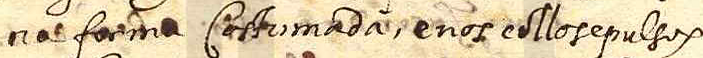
na forma Costumada, e nos collos e pulsos
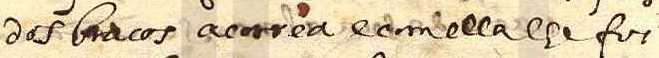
dos bracos a correa e com ella lhe foi
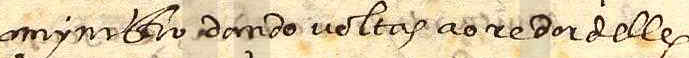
o mynistro dando uoltas ao redor delles
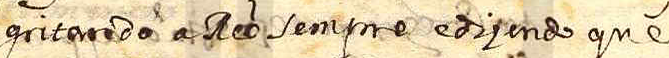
gritando a Re_ sempre e dizendo que
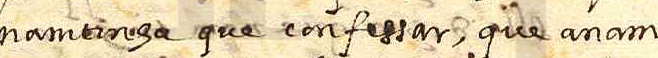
nam tinha que confessar, que a nam
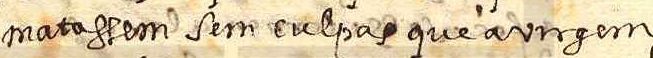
matassem sem culpas que a virgem
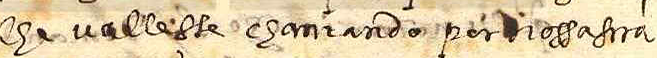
lhe ualesse chamando por nossa snā
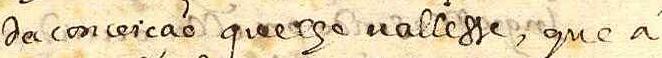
da conceiçaõ que lhe uallesse, que á
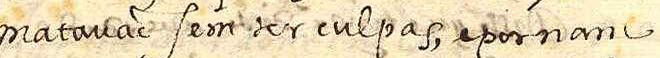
matauaõ sem ter culpas, e por nam
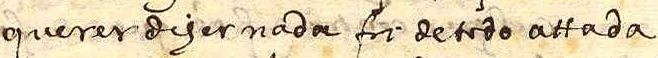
querer dizer nada foi de todo attada
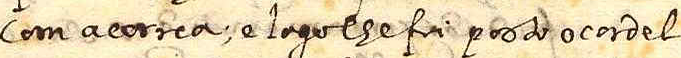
com a correa; e logo lhe foi posto o cordel
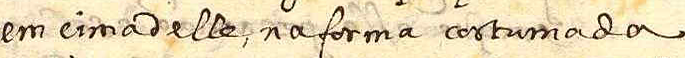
em çima della, na forma costumada
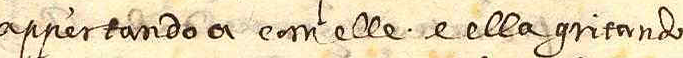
appertando a com elle. e ella gritando
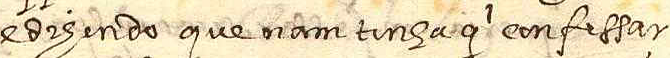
e dizendo que nam tinha q̄ confessar
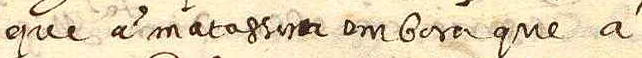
que á matassem embora que á
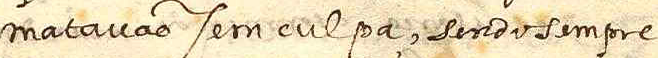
matauaõ sem culpa, sendo sempre
